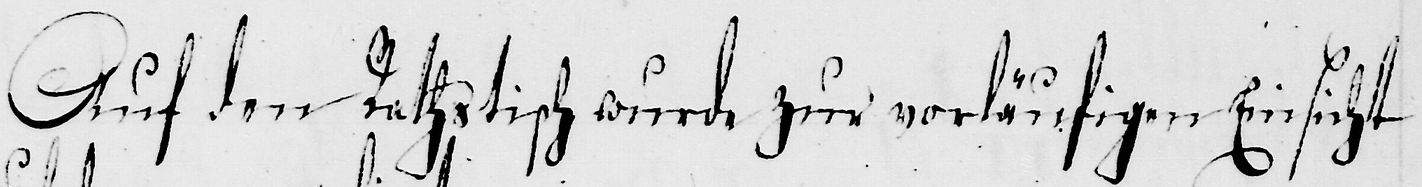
Auf den Rathstisch wurde zur vorläufigen Einsicht
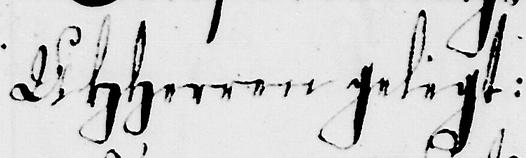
UHHerren gelegt:
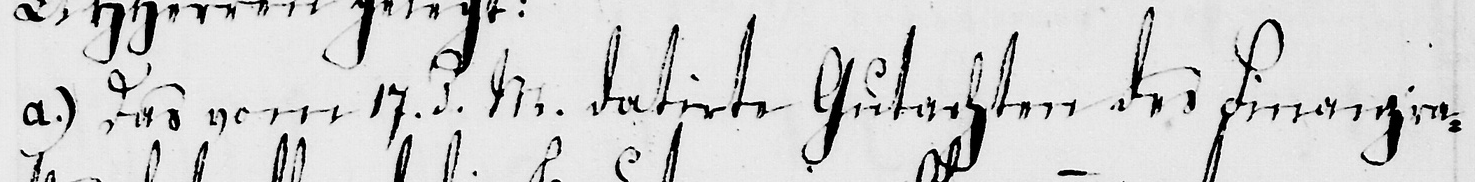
a.) Das vom 17. d. M. datirte Gutachten des Finanzra¬
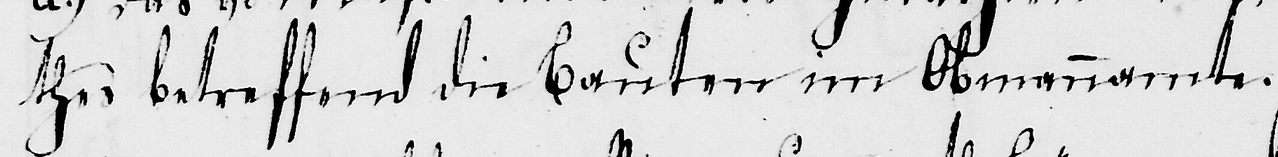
thes betreffend die Bauten im Obmannamte.
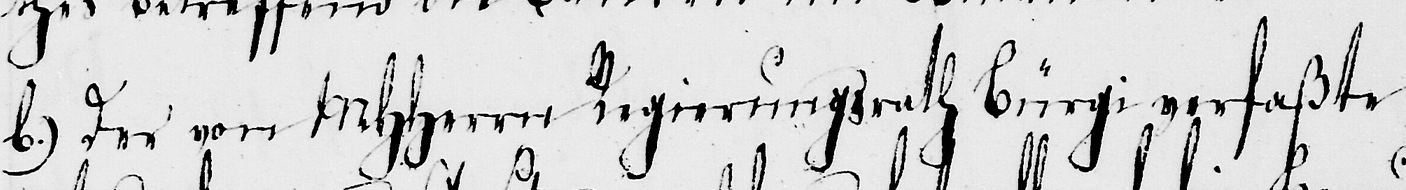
b.) Der von MHHerrn Regierungsrath Bürgi verfaßte
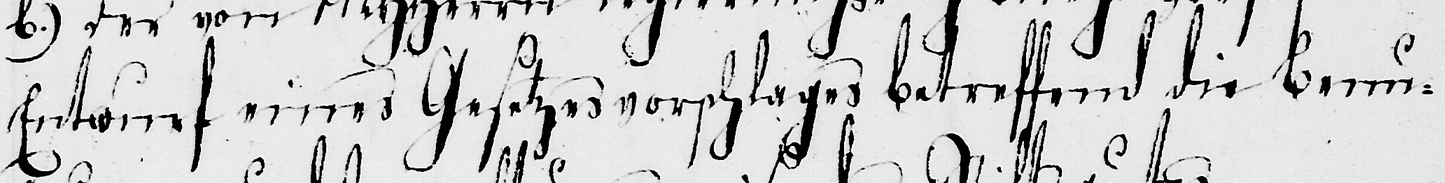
Entwurf eines Gesetzesvorschlages betreffend die Benu¬
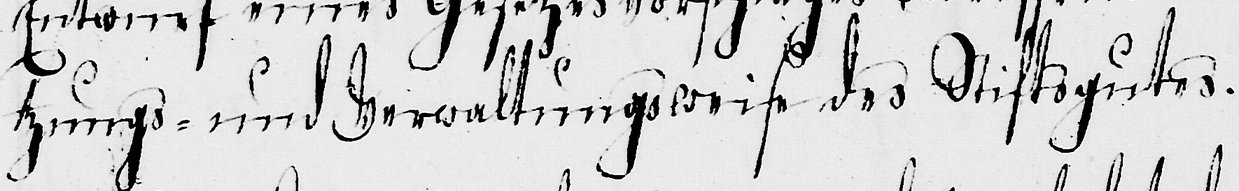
tzungs- und Verwaltungsweise des Stiftsgutes.
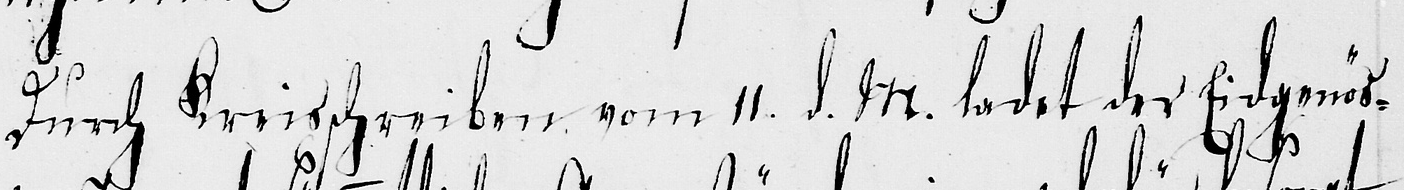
Durch Kreisschreiben vom 11. d. M. ladet der Eidgenöß¬
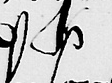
gen des
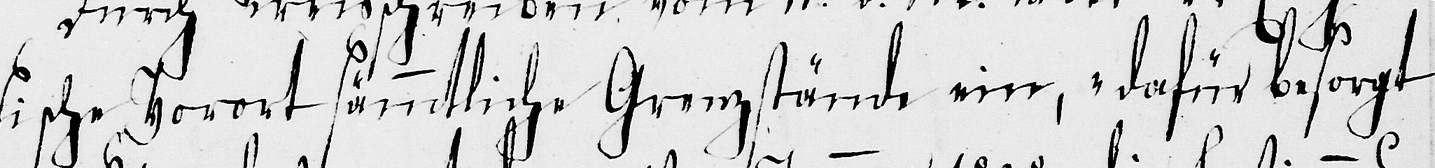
ische Vorort sämmtliche Grenzstände ein, „dafür besorgt
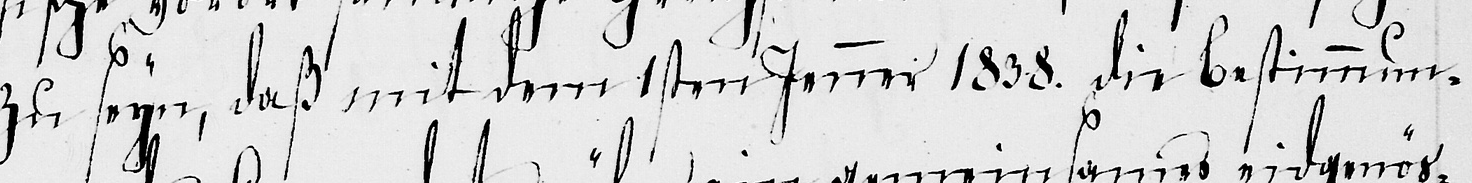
zu seyn, daß mit dem 1sten Jenner 1838. die Bestimmun¬
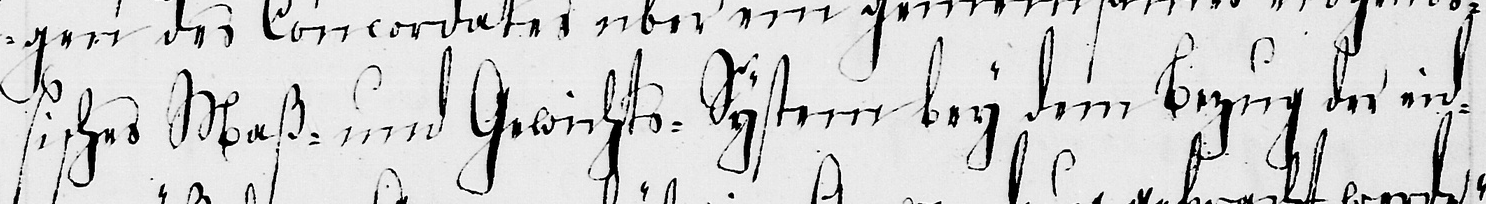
isches Maß- und Gewichts-System bey dem Bezug der eid¬
